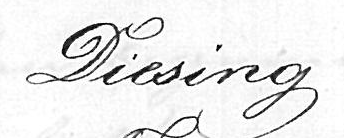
Diesing
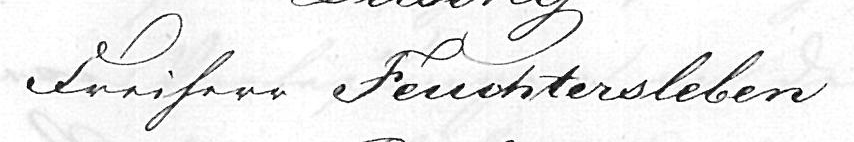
Freiherr Feuchtersleben
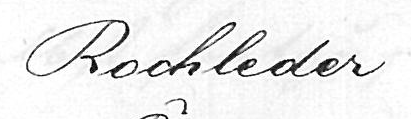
Rochleder
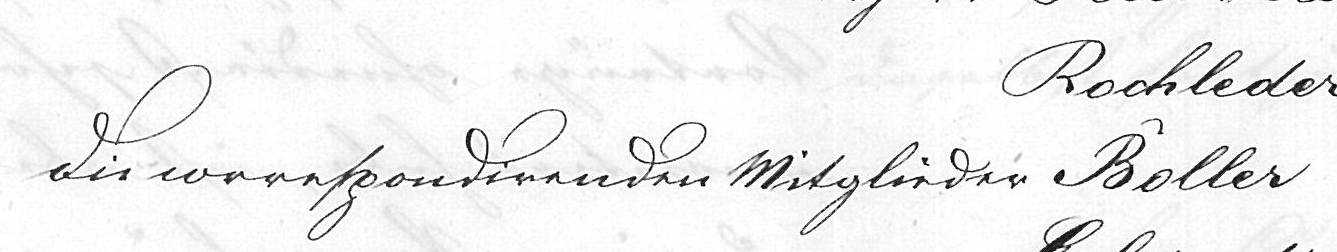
Die correspondirenden Mitglieder Boller
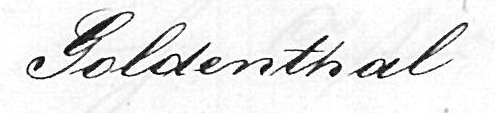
Goldenthal
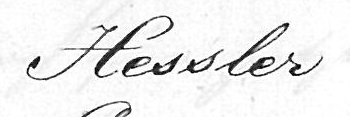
Hessler
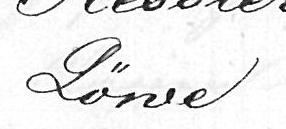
Löwe
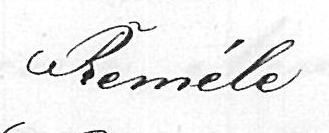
Reméle
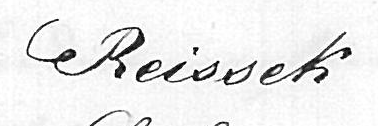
Reissek
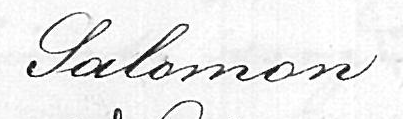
Salomon
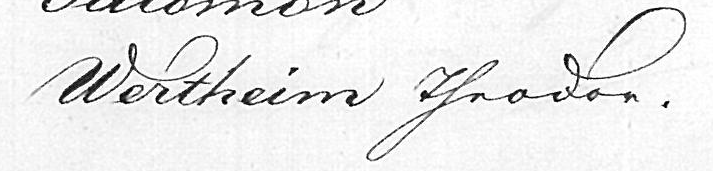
Wertheim Theodor
